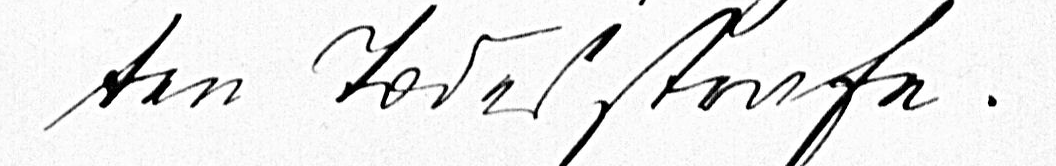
ten Todes strafe.
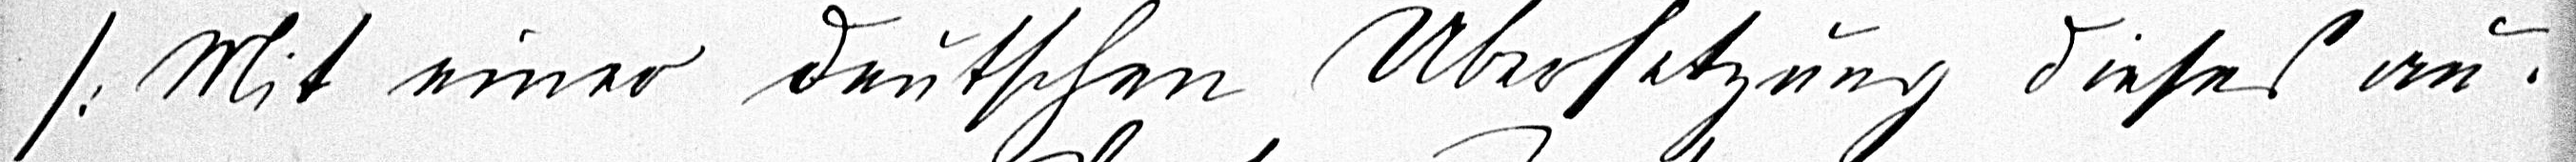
/: Mit einer deutschen Übersetzung dieses au.
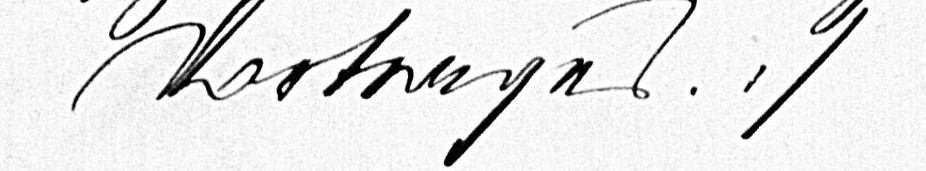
Vortrages. ./
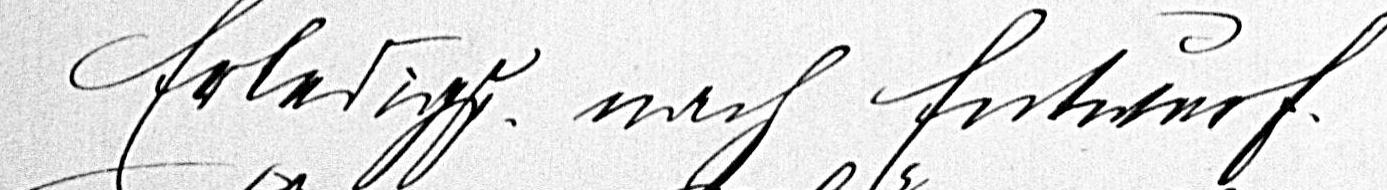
Erledigg. nach Entwurf.
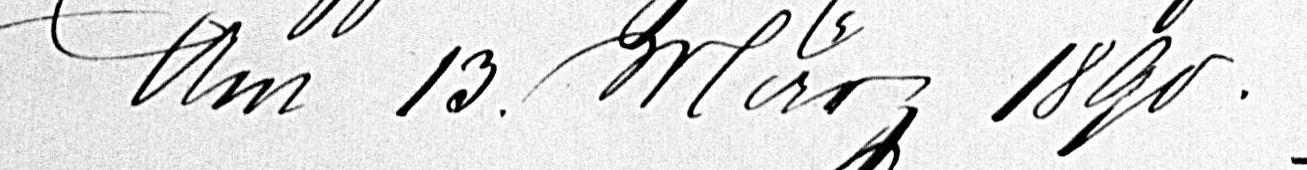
Am. 13. März 1890.
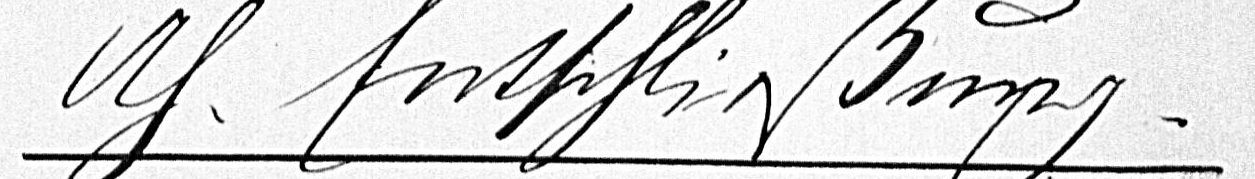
Uh. Entschlißung.
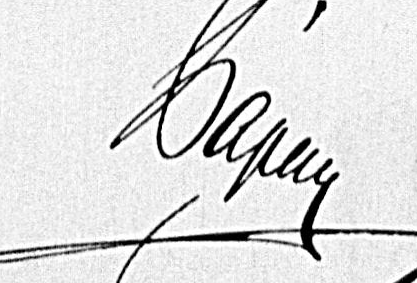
xx
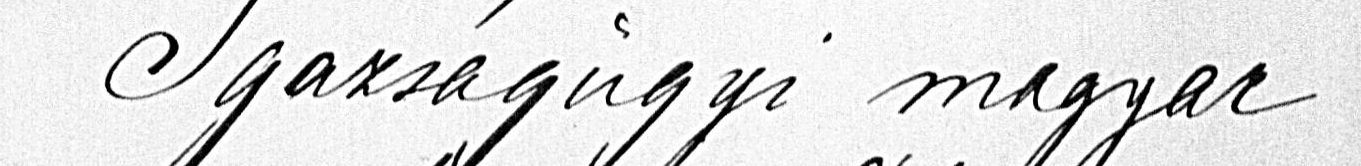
Igazságügyi magyar
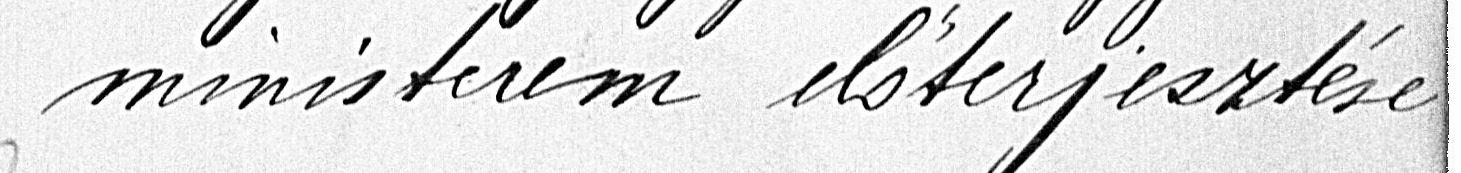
ministerem elöterjesztése
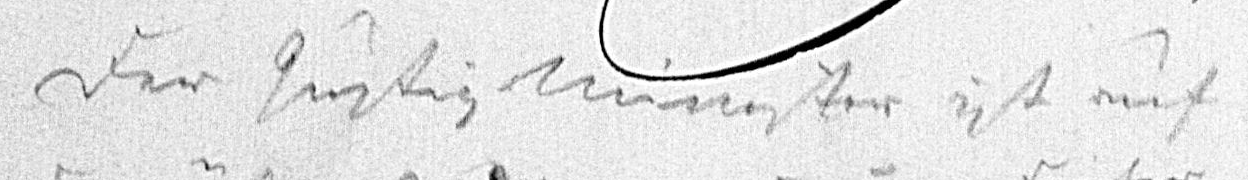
der Gürtig Minister ist auf
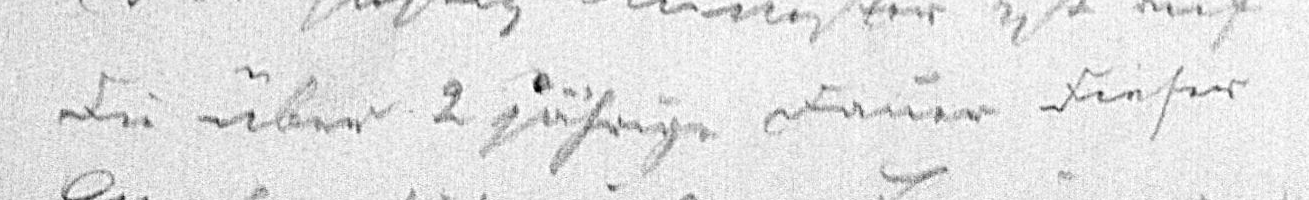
die über 2 jährige Dauer Fieser
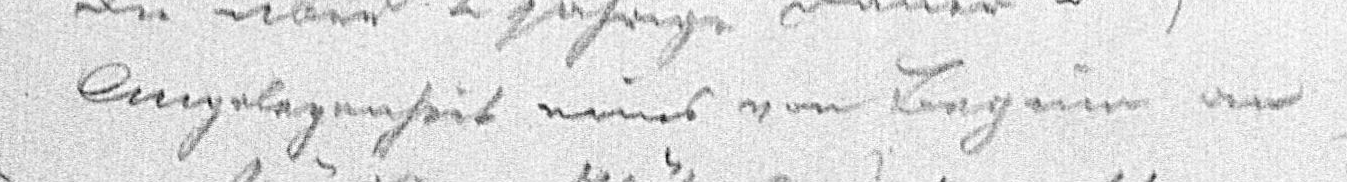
Angelegenheit eines von Bagein am
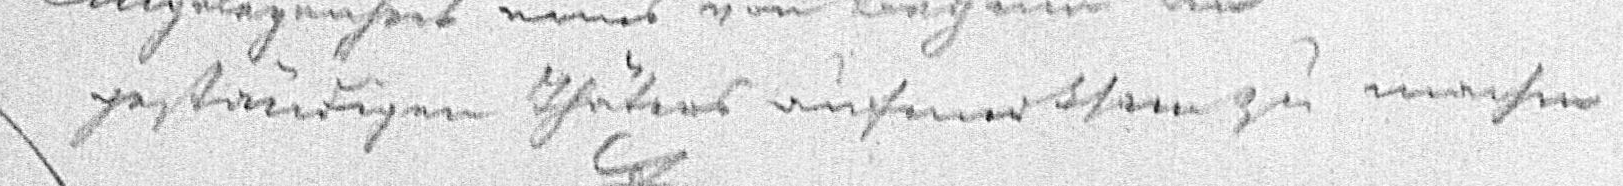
geständigen Thäters aufmerssam zu machen
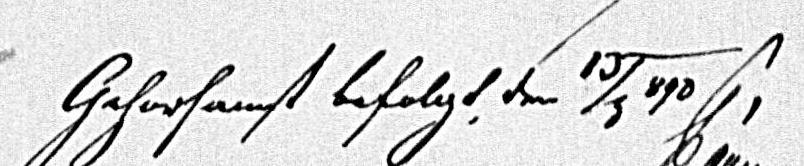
Gehorsamst befolgd. den 13/3 890
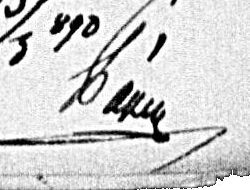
xx
